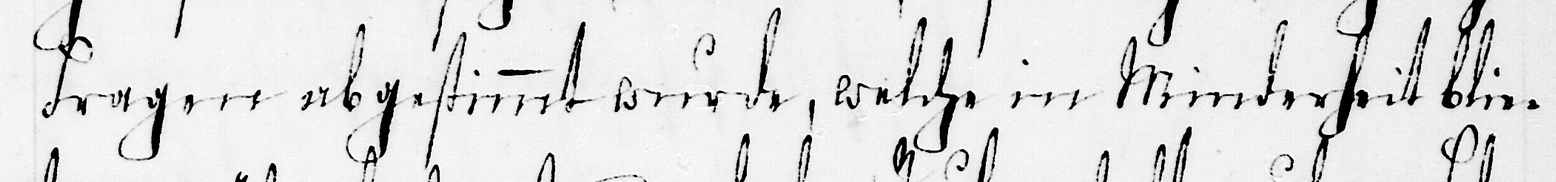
Fragen abgestimmt wurde, welche in Minderheit blie¬
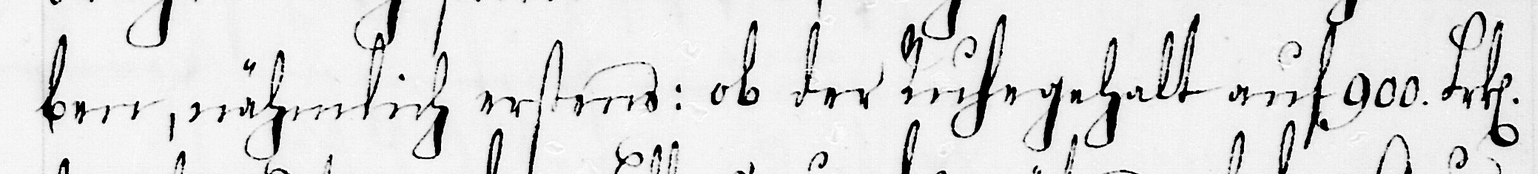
ben, nähmlich erstens: ob der Ruhegehalt auf 900. Fr¬
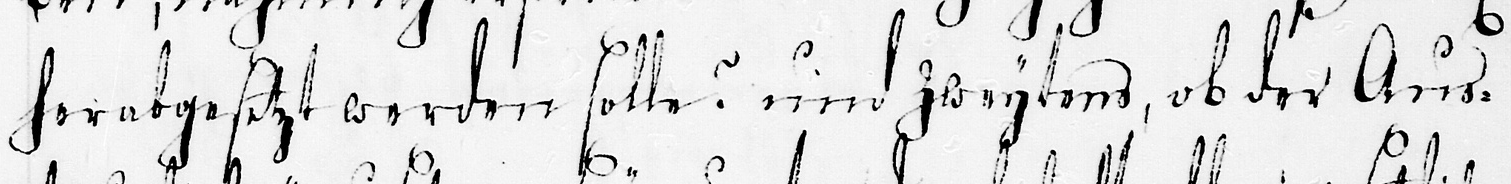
herabgesetzt werden solle? und zweytens, ob der Aus¬
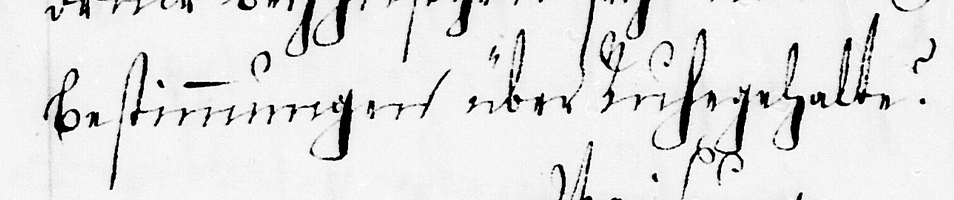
Bestimmungen über Ruhegehalte?
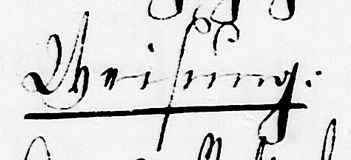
Weisung:
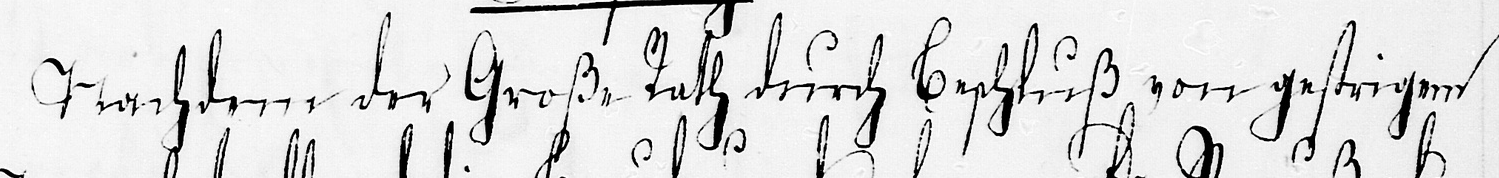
Nachdem der Große Rath durch Beschluß von gestrigem
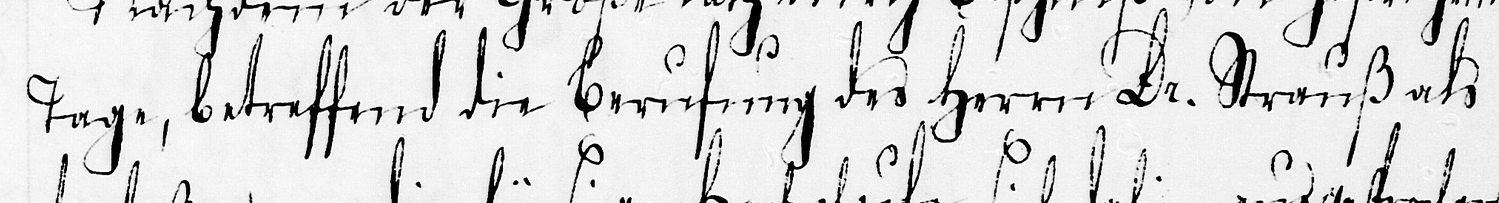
Tage, betreffend die Berufung des Herrn Dr. Strauß als
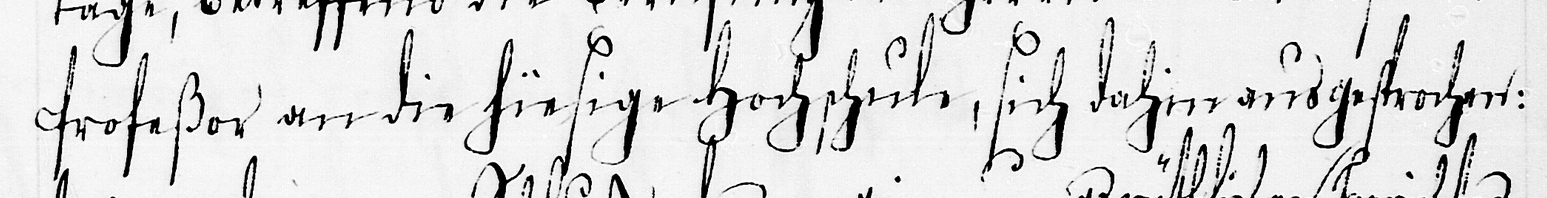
Profeßor an die hiesige Hochschule, sich dahin ausgesproche¬
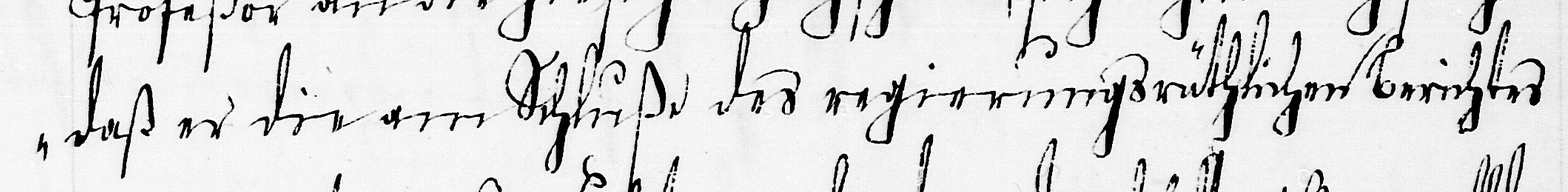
„daß er die am Schluße des regierungsräthlichen Berichtes
